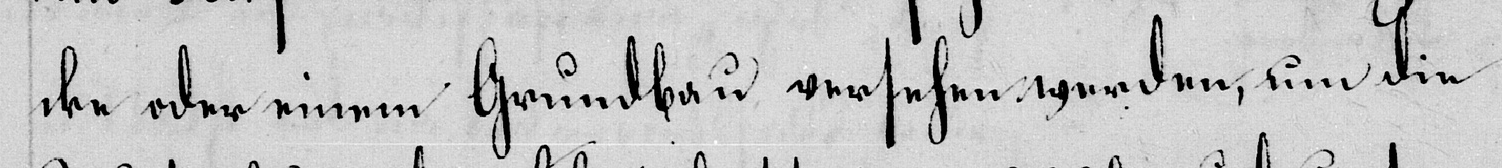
cke oder einem Grundbau versehen werden, um die
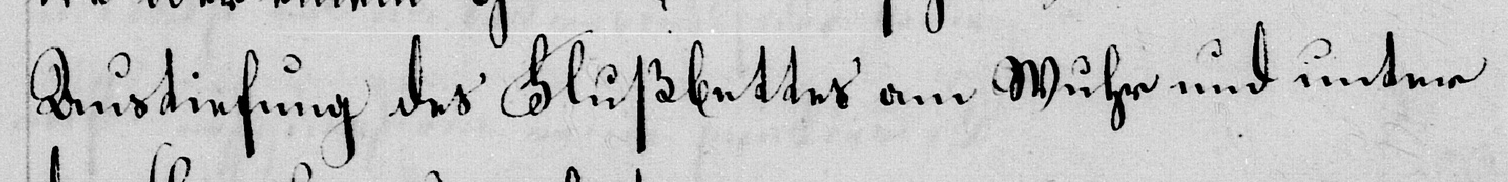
Austiefung des Flußbettes am Wuhr und unter
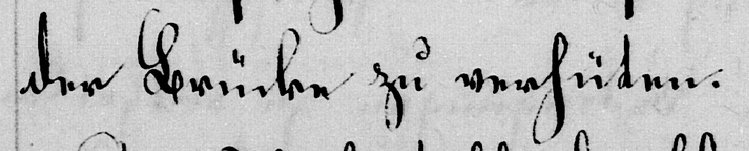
der Brücke zu verhüten.
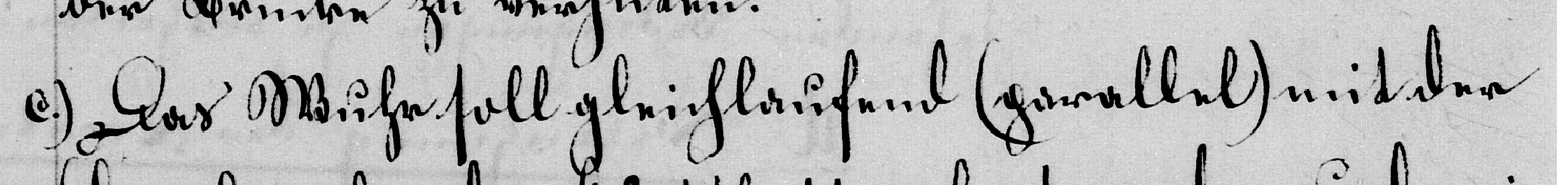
c.) Das Wuhr soll gleichlaufend (parallel) mit der
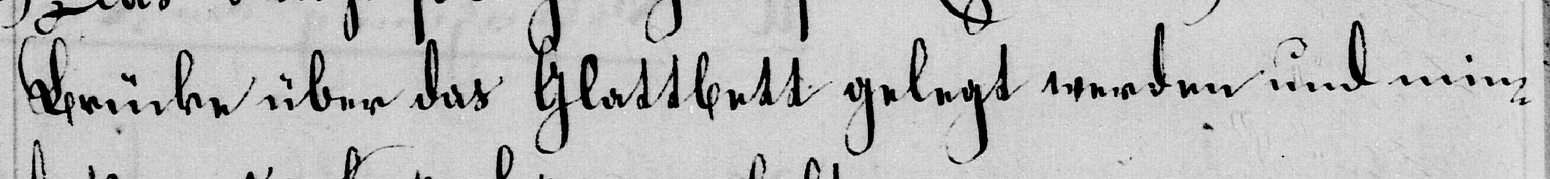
Brücke über das Glattbett gelegt werden und min¬
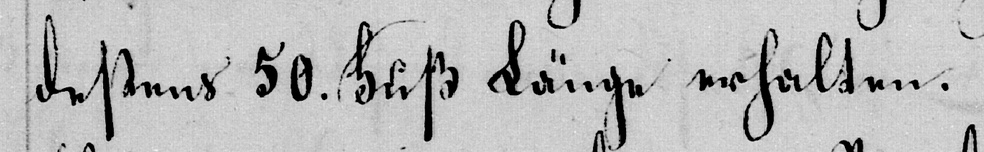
destens 50. Fuß Länge erhalten.
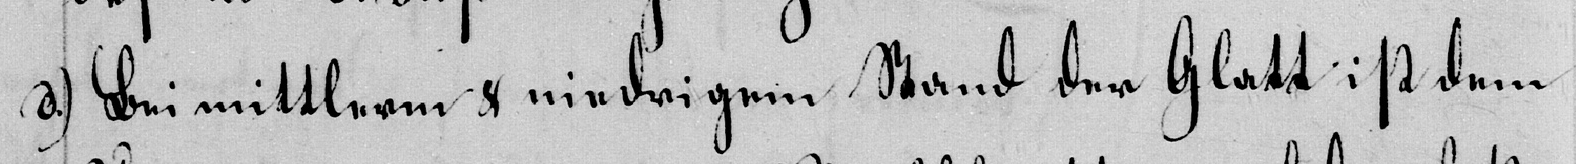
d.) Bei mittlerem & niedrigem Stand der Glatt ist dem
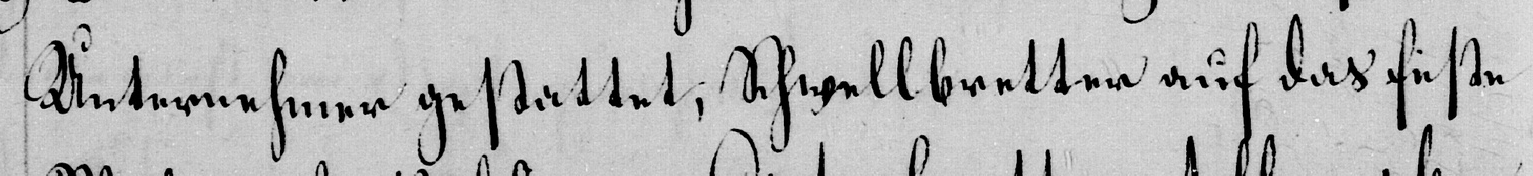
Unternehmer gestattet, Schwellbretter auf das feste
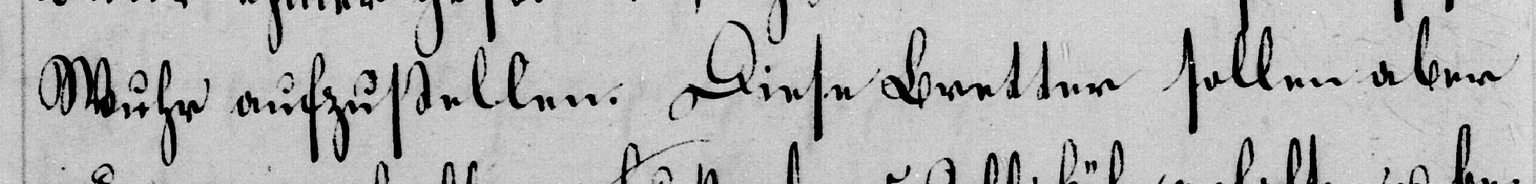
Wuhr aufzustellen. Diese Bretter sollen aber
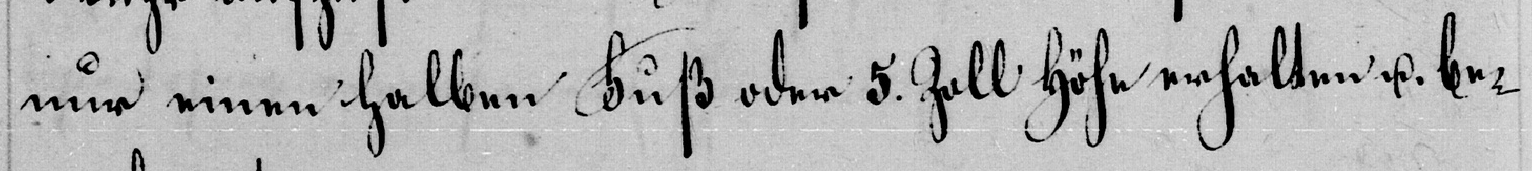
nur einen halben Fuß oder 5. Zoll Höhe erhalten u. be¬
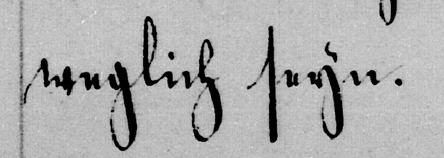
weglich seyn.
